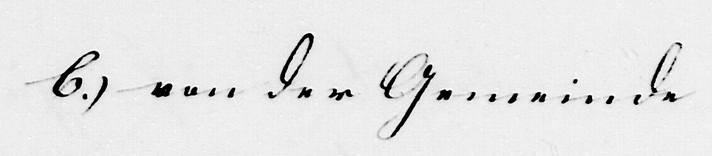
b.) von der Gemeinde
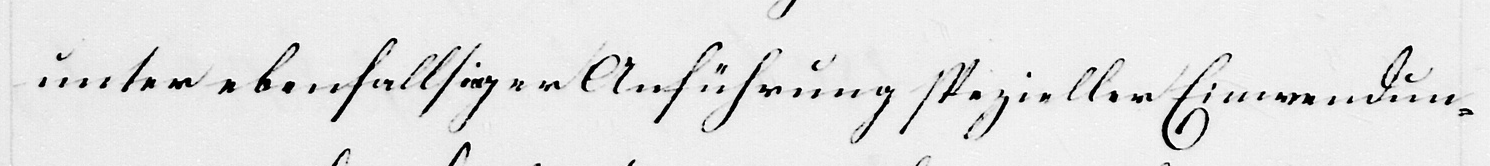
unter ebenfallsiger Anführung spezieller Einwendun¬
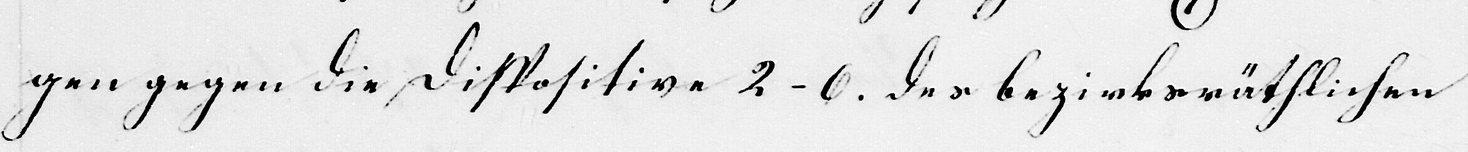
gen gegen die Dispositive 2−6. des bezirksräthlichen
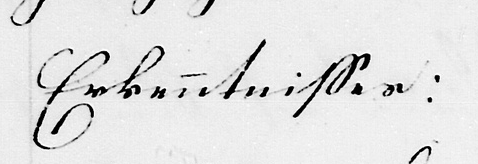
Erkenntnißes:
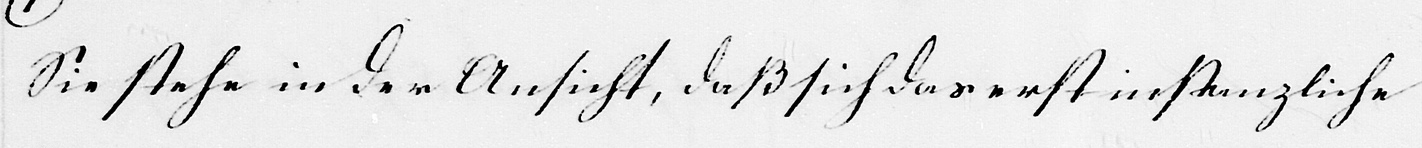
Sie stehe in der Ansicht, daß sich das erstinstanzliche
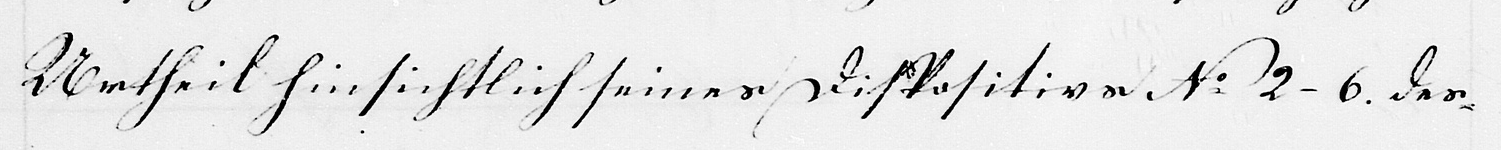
Urtheil hinsichtlich seines Dispositivs No 2−6. des¬
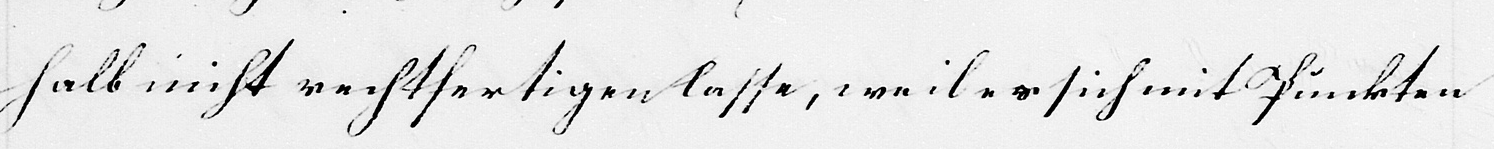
halb nicht rechtfertigen lasse, weil es sich mit Punkten
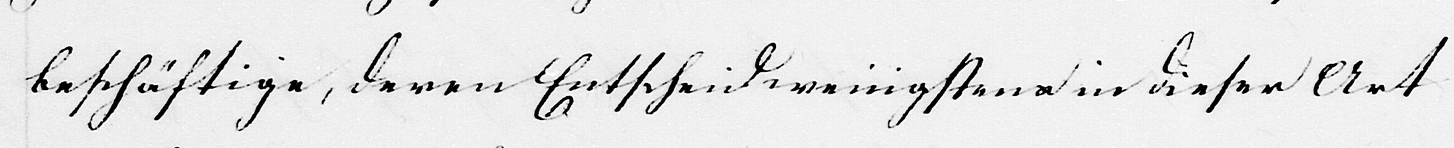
beschäftige, deren Entscheid wenigstens in dieser Art
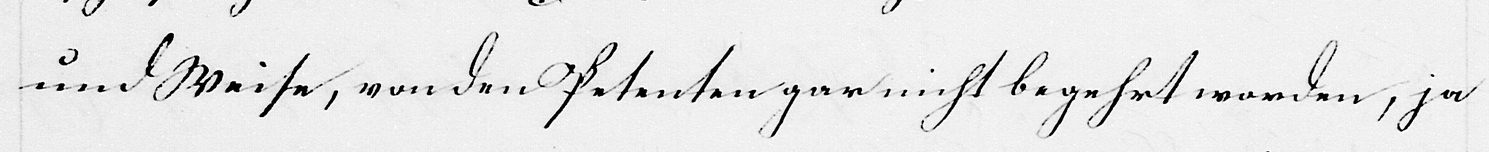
und Weise, von den Petenten gar nicht begehrt worden, ja
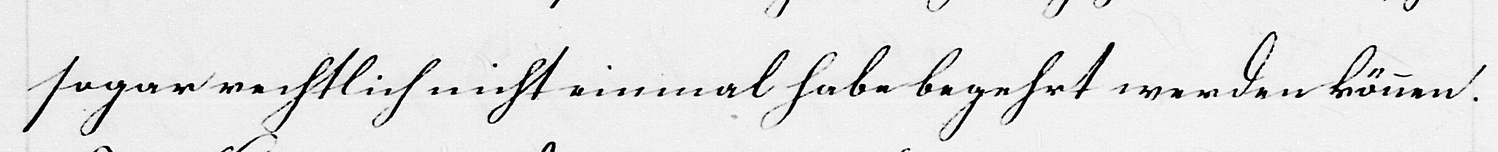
sogar rechtlich nicht einmal habe begehrt werden können.
